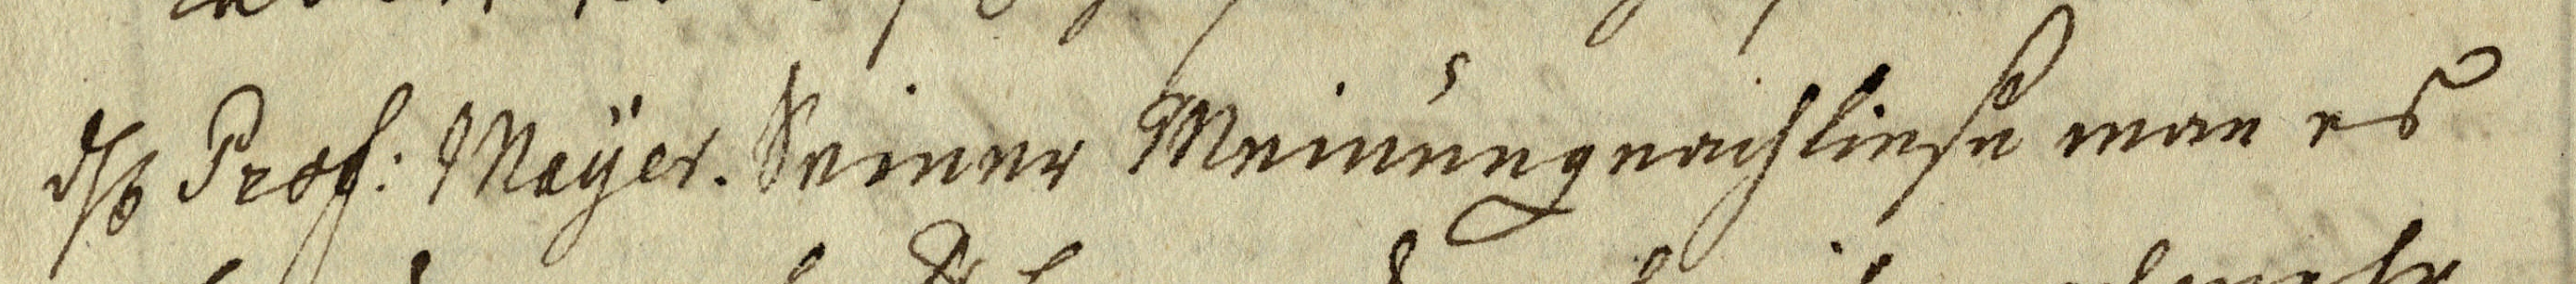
dh Prof: Maÿer. Seiner Meinung nach ließe man es
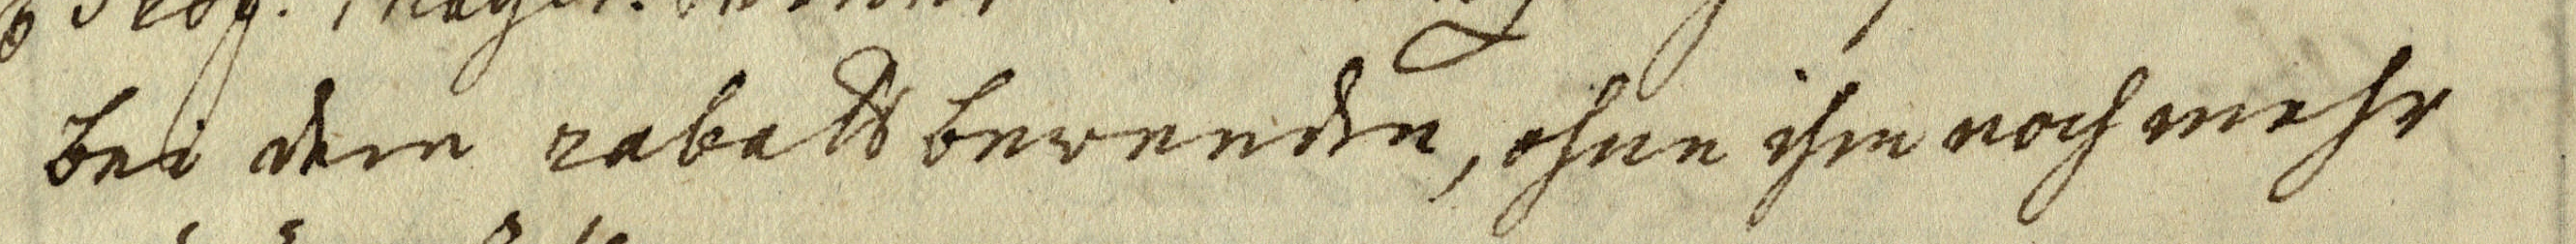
bei dem rabatt bewenden, ohne ihm noch mehr
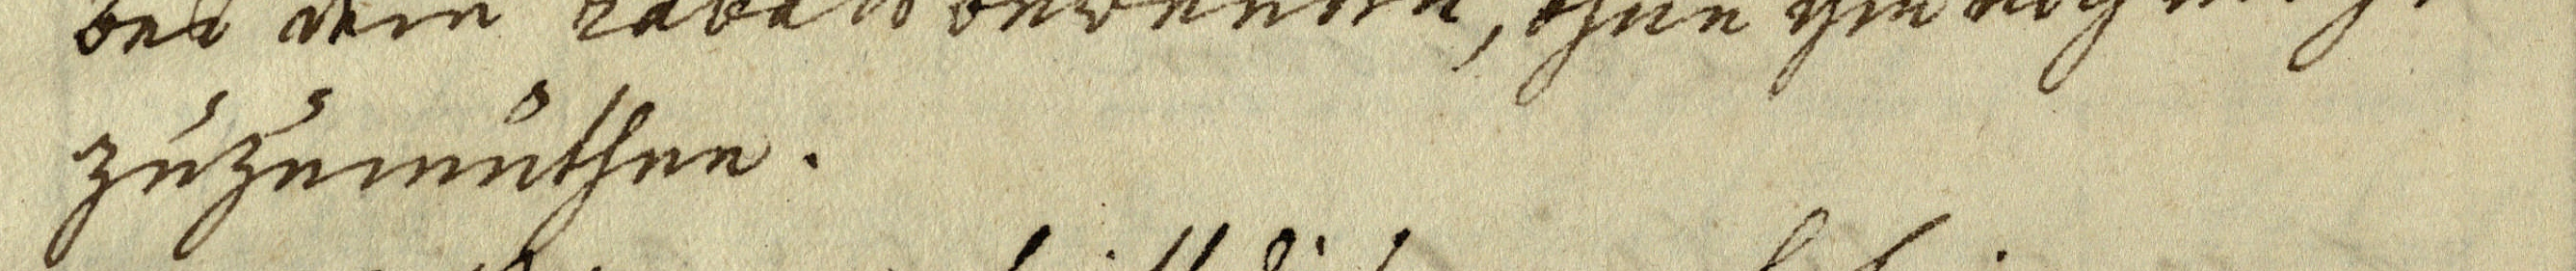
zuzumuthen.
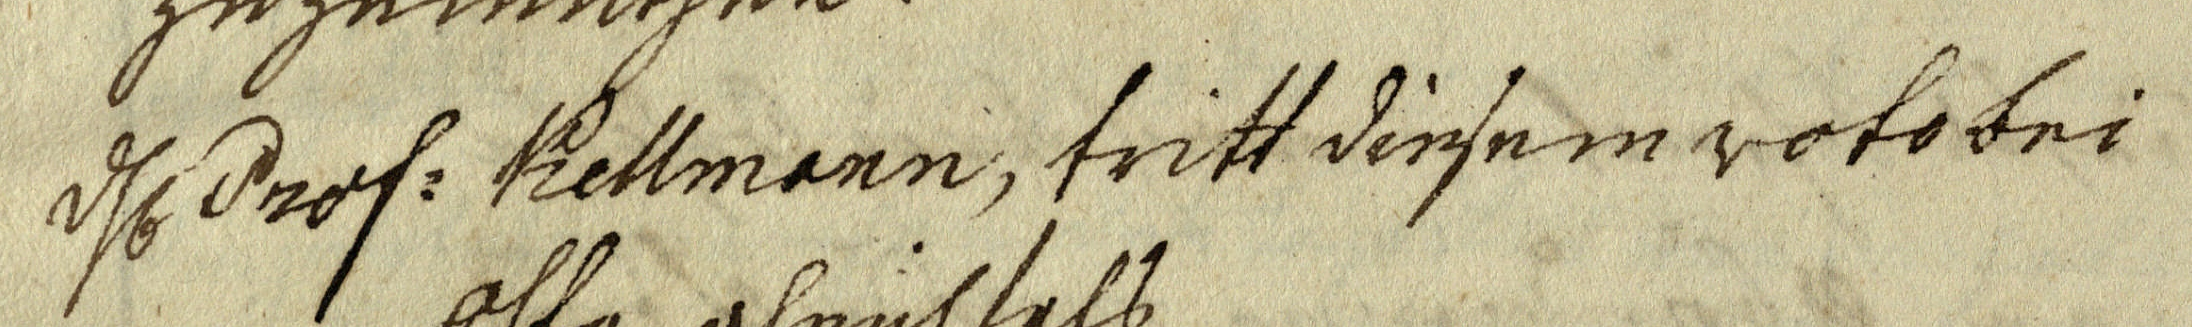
dh Prof: Kellmann, tritt diesem voto bei
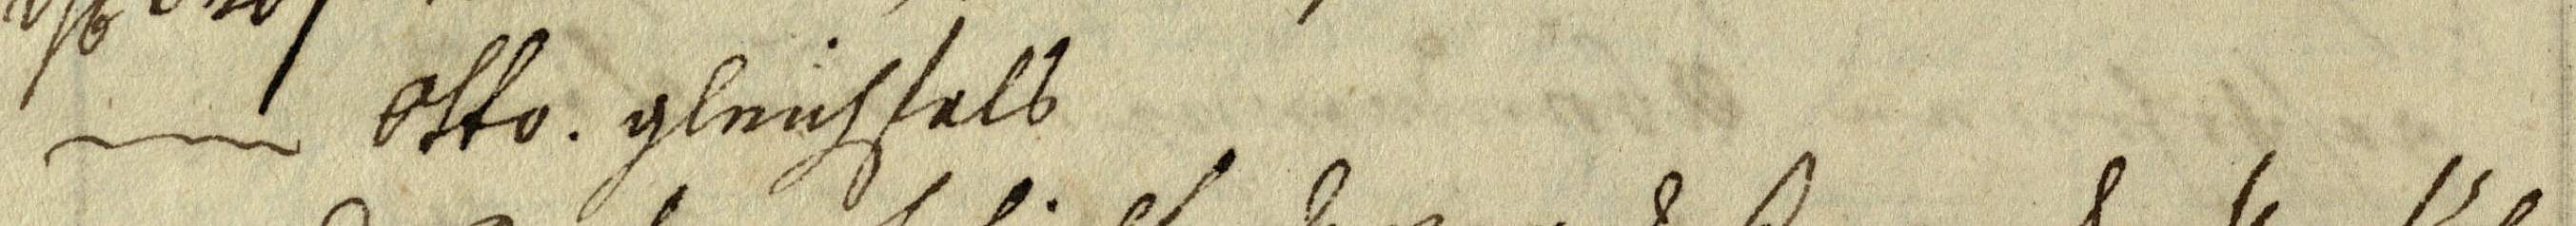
Otto gleichfals
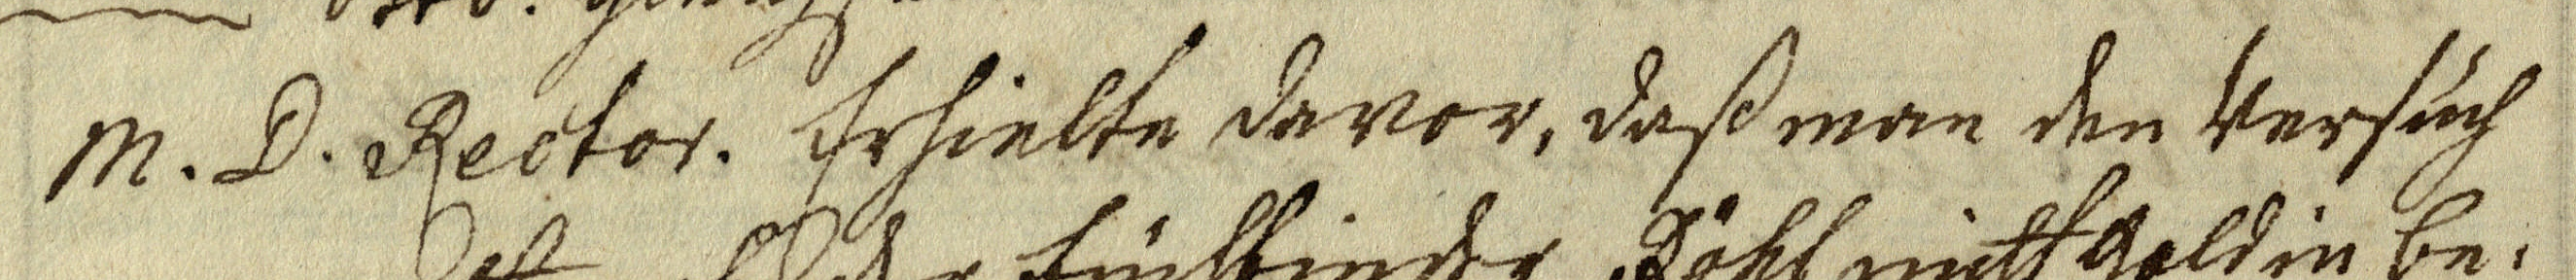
M. D. Rector. Erhielte davor, daß man den Versuch
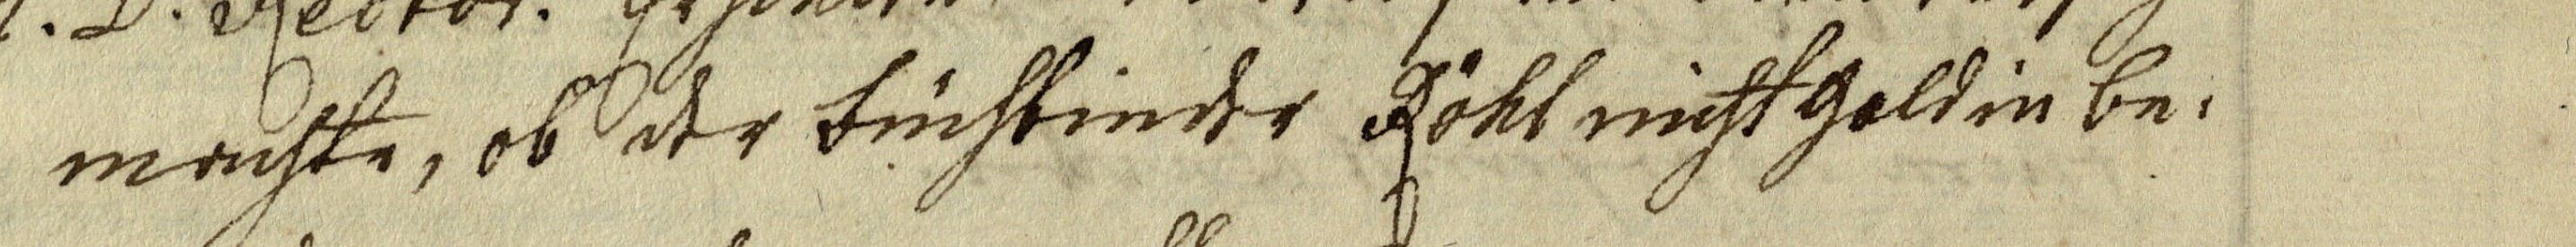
machte, ob der Buchbinder Röhl nicht Gold in be¬
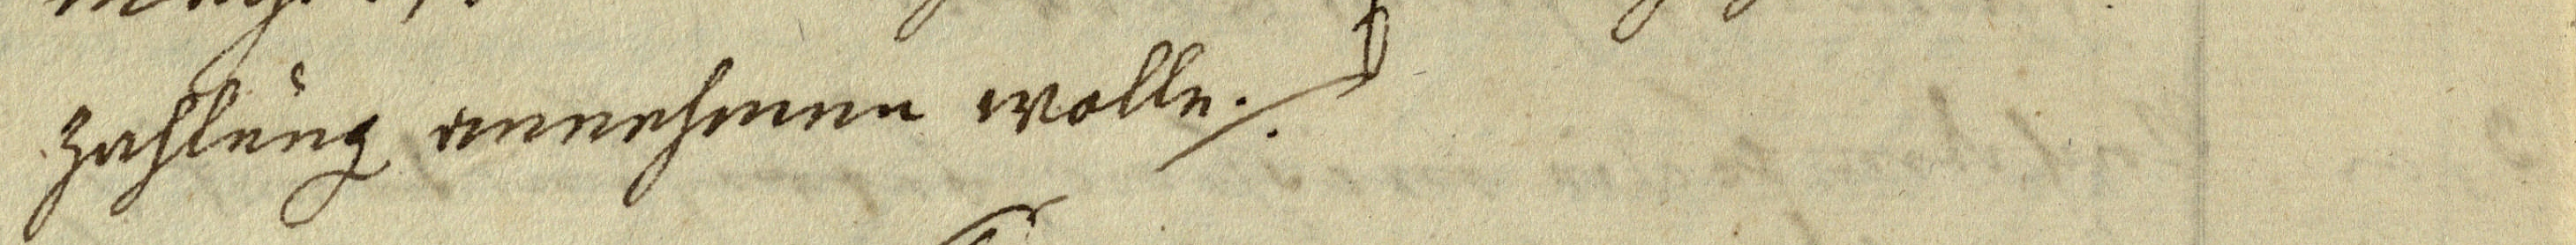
zahlung annehmen wolle.
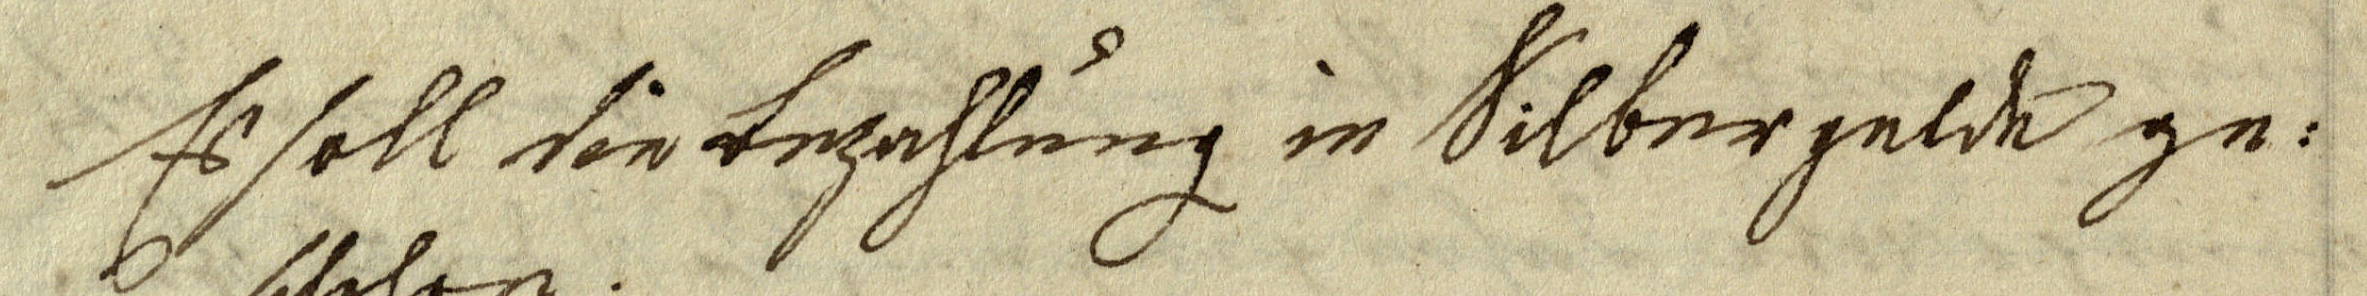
Es soll die Bezahlung in Silbergelde ge¬
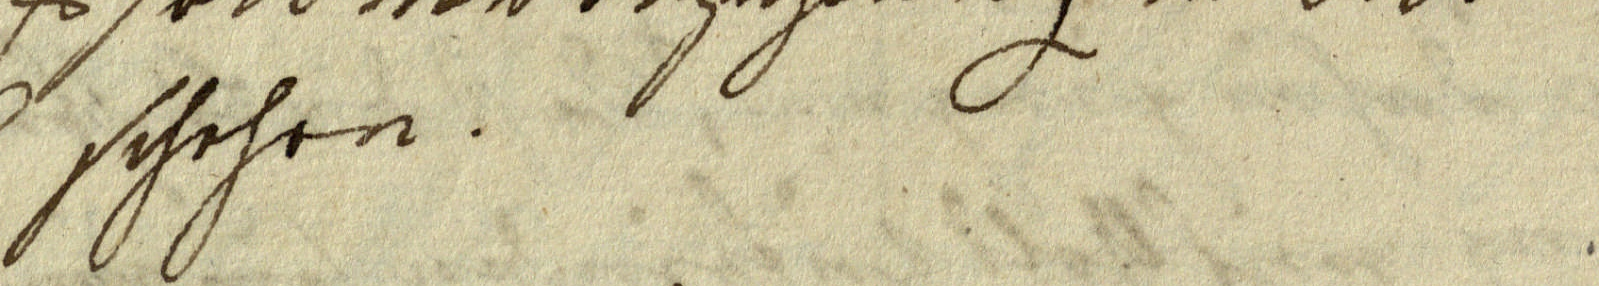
schehen.
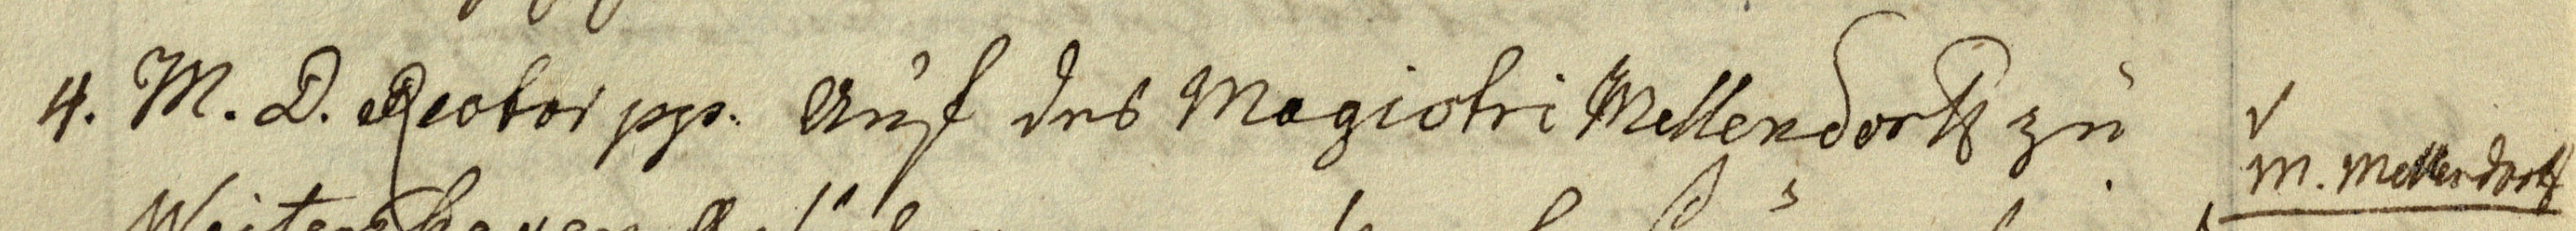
4. M. D. Rector pp. Auf des Magistri Mellendorff zu
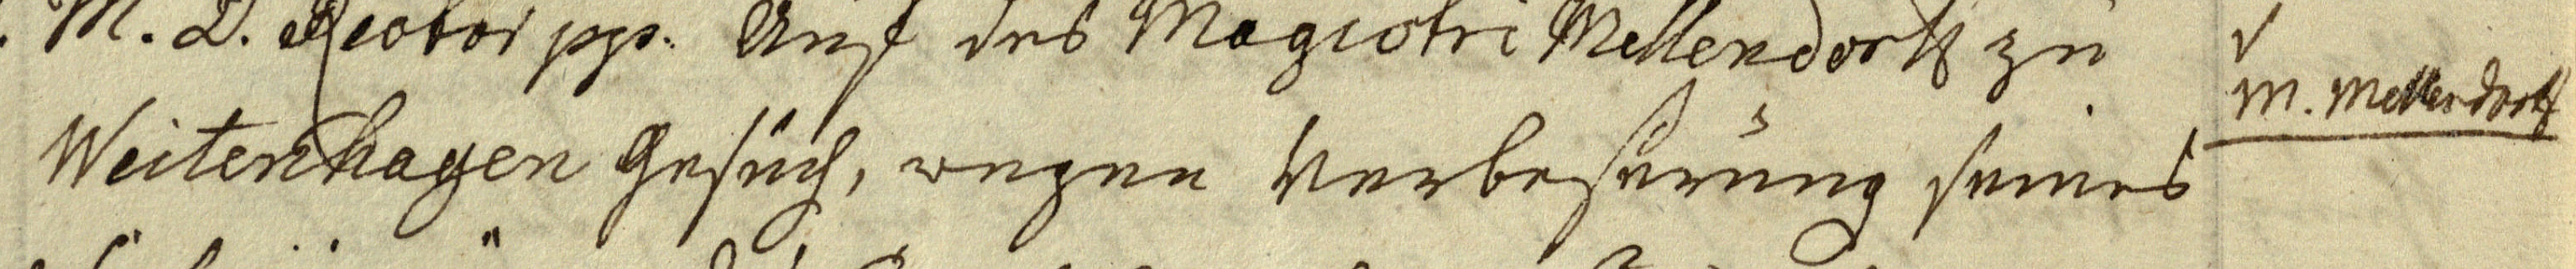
Weitenhagen Gesuch, wegen Verbeßerung seines M.Mellendorff
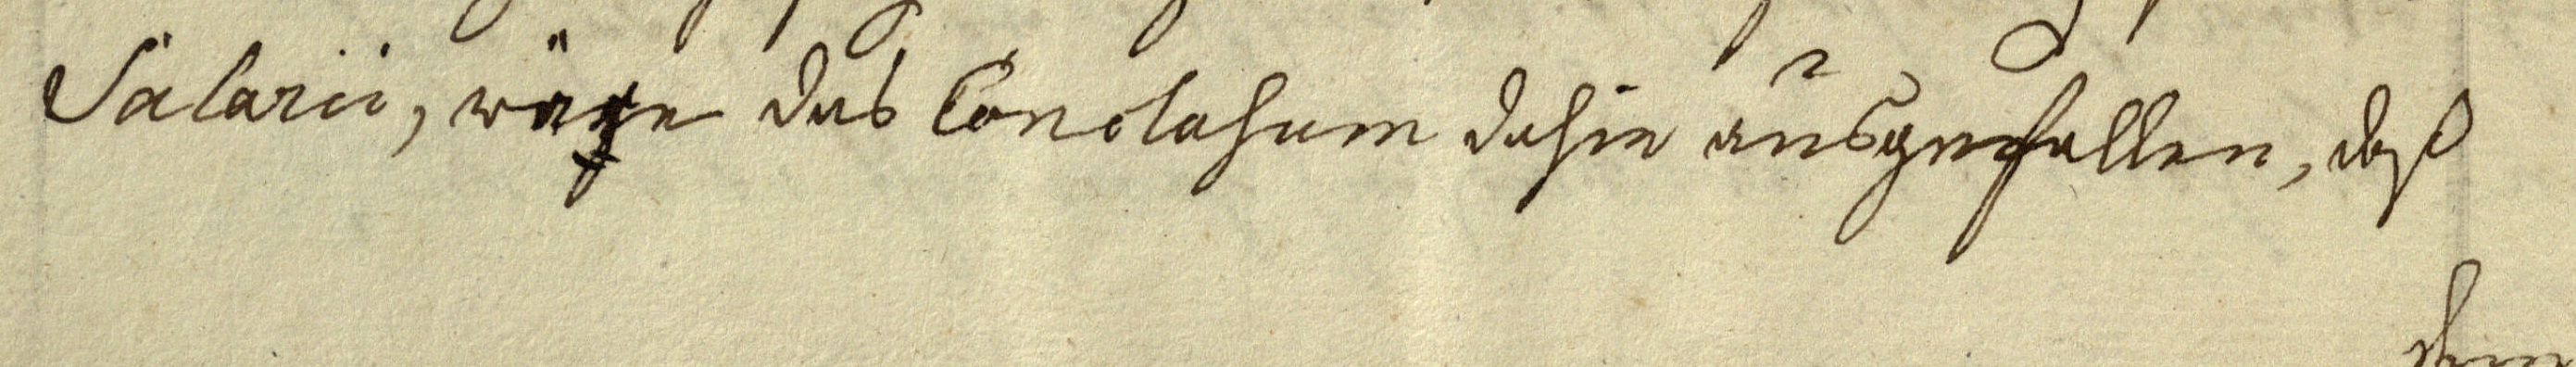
Salarii, wäre das Conclusum dahin ausgefallen, daß
